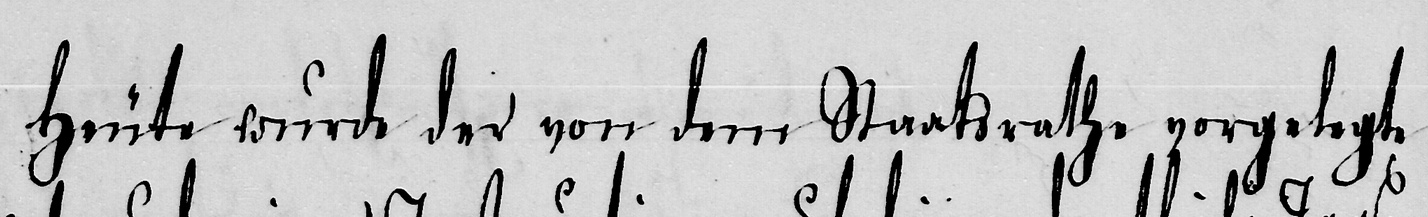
Heute wurde der von dem Staatsrathe vorgelegte
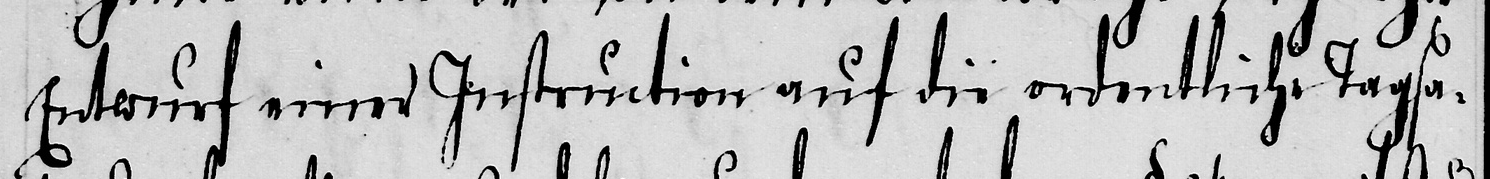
Entwurf einer Instruction auf die ordentliche Tagsa¬
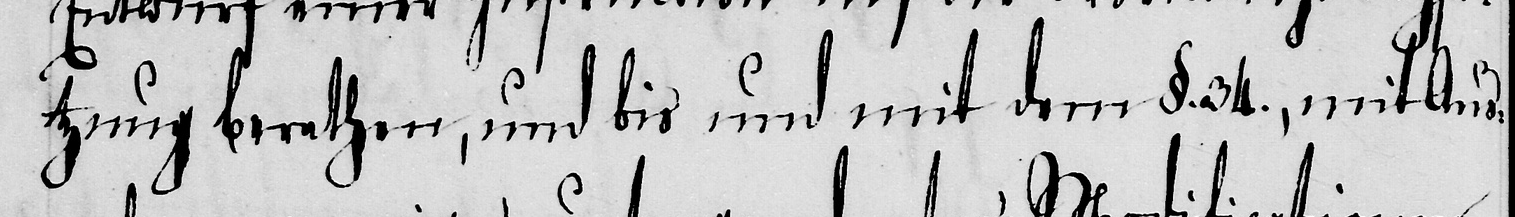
tzung berathen, und bis und mit dem §. 34., mit Aus¬
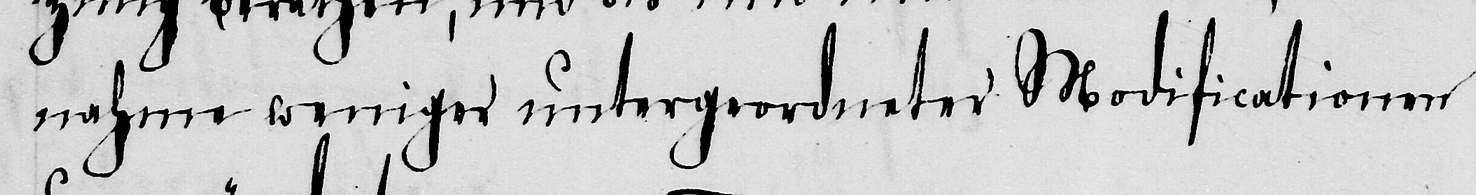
nahme weniger untergeordneter Modificationen
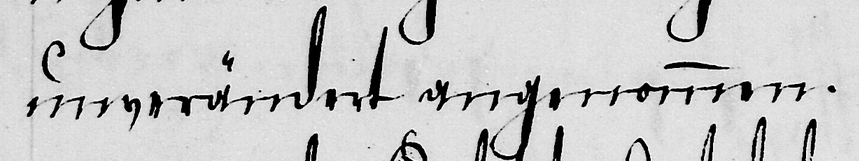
unverändert angenommen.
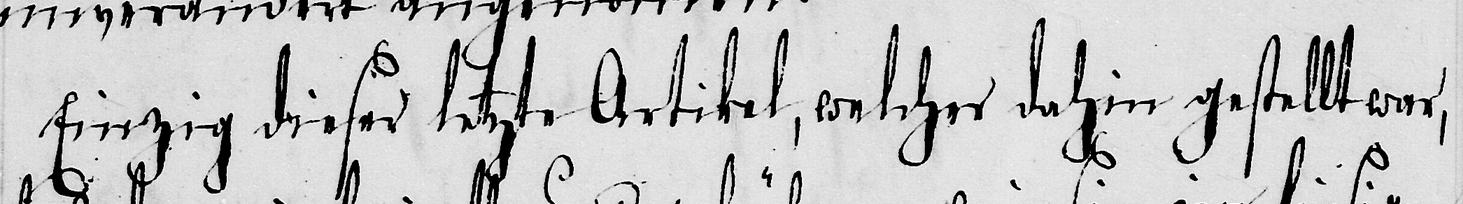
Einzig dieser letzte Artikel, welcher dahin gestellt wa¬
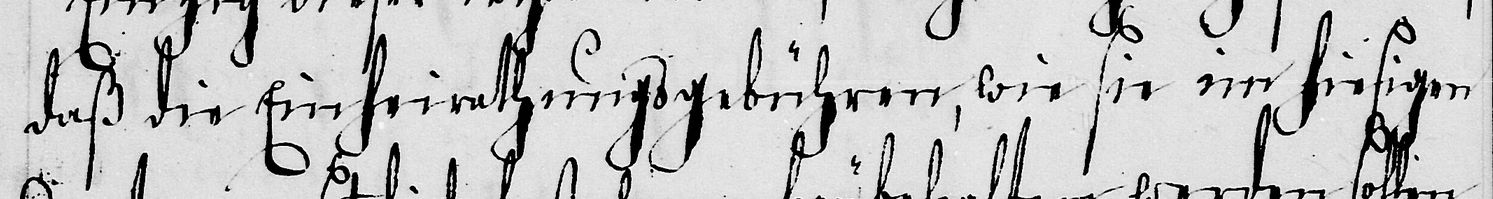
daß die Einheirathungsgebühren, wie sie im hiesigen
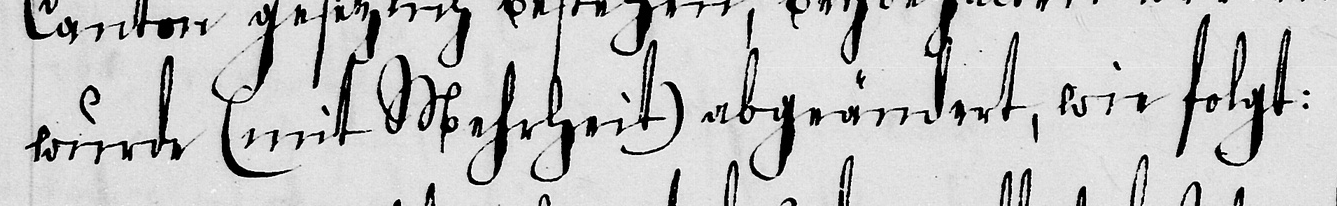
wurde (mit Mehrheit) abgeändert, wie folgt:
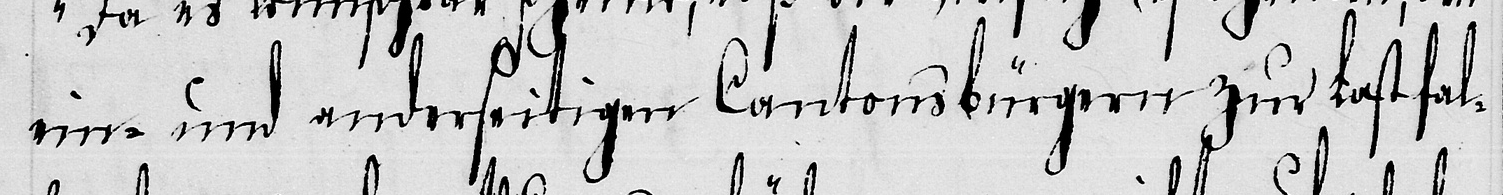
ein- und anderseitigen Cantonsbürgern zur Last fal¬
